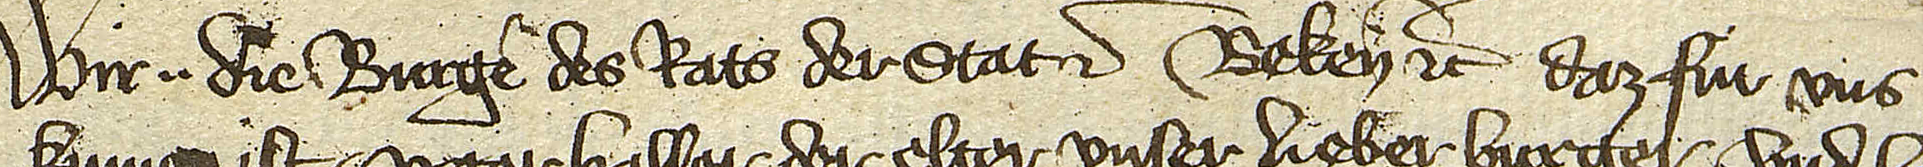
Wir ~ die Burge* des Rats der Stat ec* Beken* ec* daʒ für vns
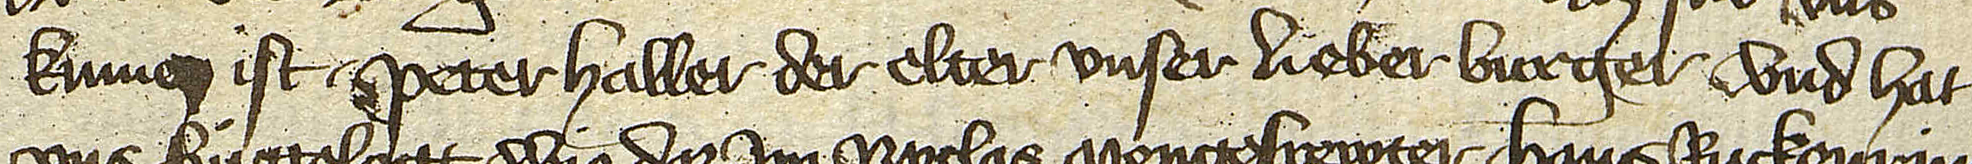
kume iſt / Peter haller der elter vnſer lieber burger / vnd hat
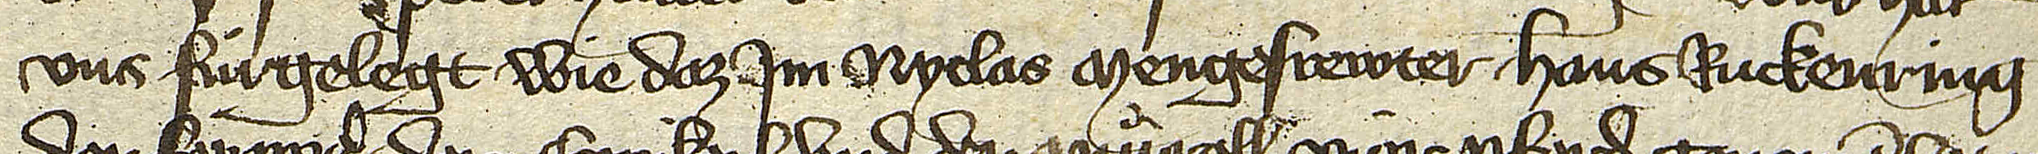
vns fürgelegt / wie daʒ Im Nyclas Mengeſrewter / hans Ruckenring
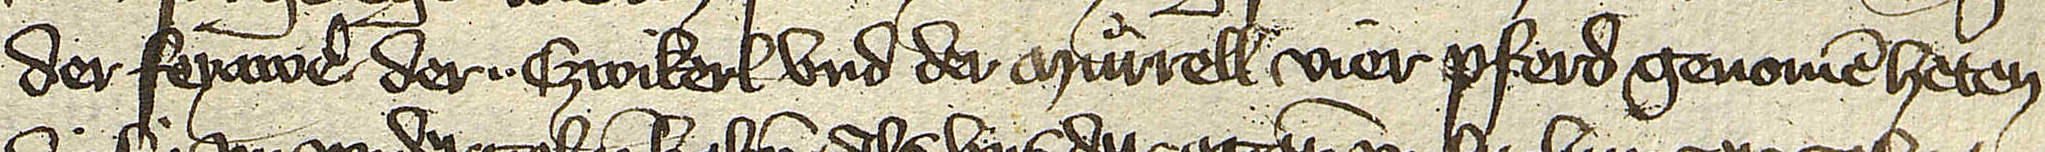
der feyawe* / der ~ Cʒwikerl vnd der Mürrell vier pferd genome* heten
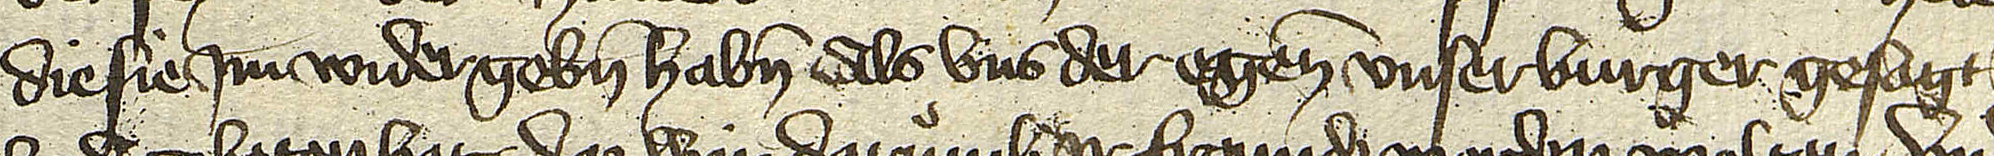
die ſie Im widergebn* habn* / Als vns der egen* vnſer burger geſagt
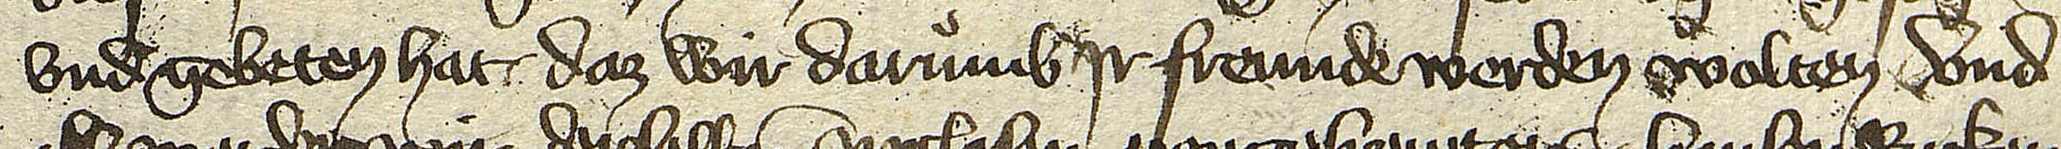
vnd gebeten hat / daʒ wir darümb Ir freunde werden wolten / vnd
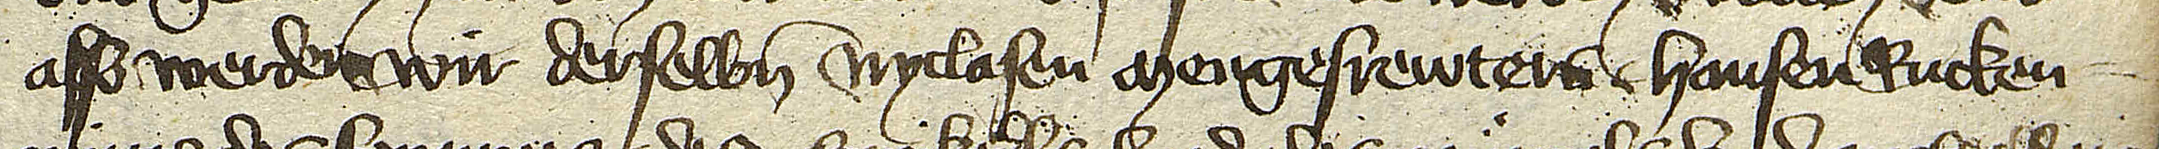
alſo werden wir derſelbn* Nyclaſen Mengeſrewters / hanſen Rucken =
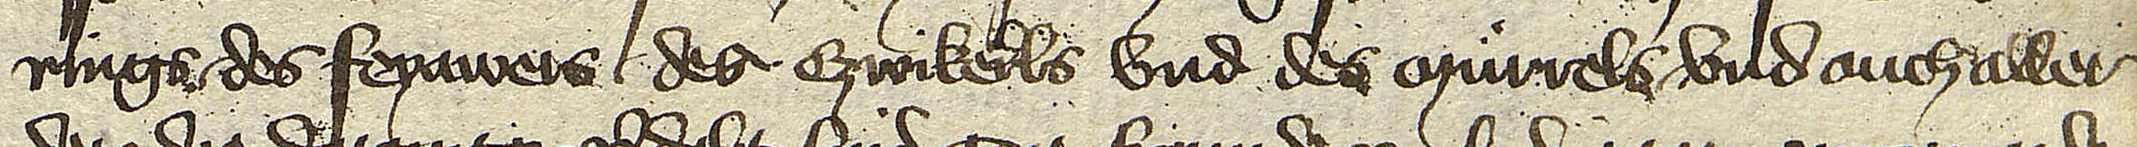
rings / des feyawers / der Cʒwikerls vnd des Mürrels / vnd auch aller
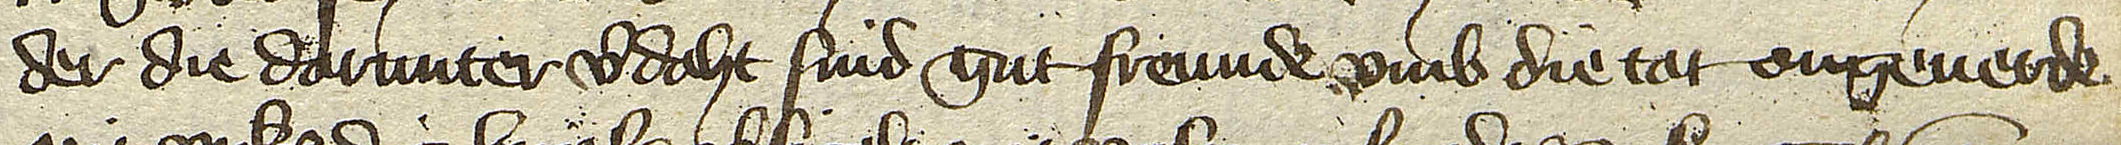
der die darunter v*daht ſind gut freunde vmb die tat ongeuerde
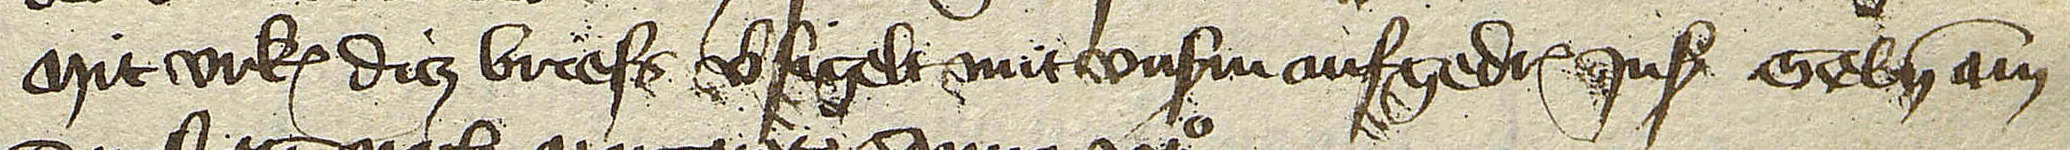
Mit vrk* dicʒ briefs v*ſigelt mit vnſ*m aufgedr* Inſ* Gebn* am
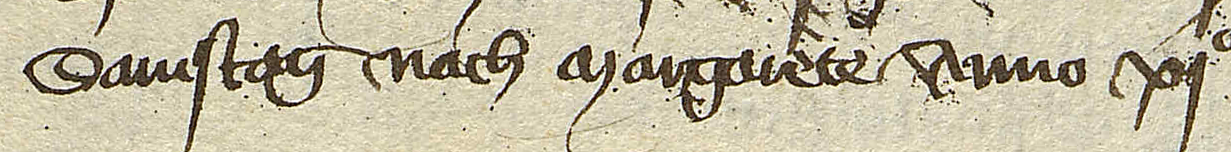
Samſtag nach Margarete / Anno xi*
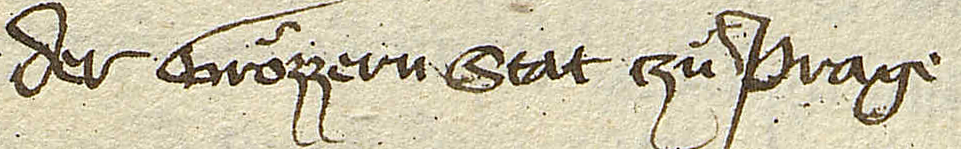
der Gröʒʒern Stat cʒü Prage
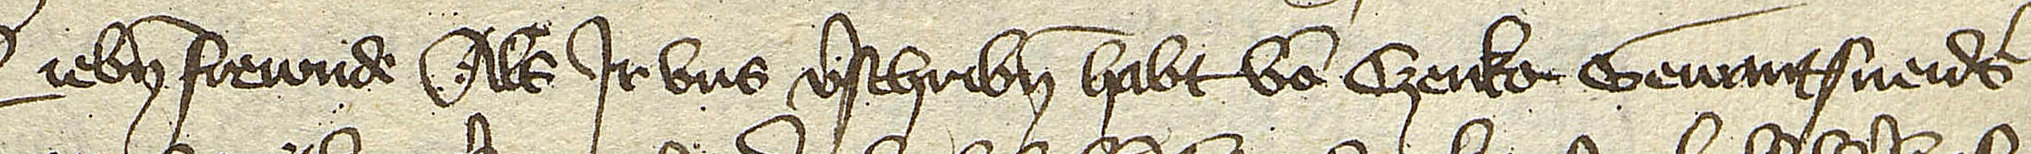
Liebn* frewnde Als Ir vns v*ſchribn* habt vo* Cʒenko Gewantſneids*
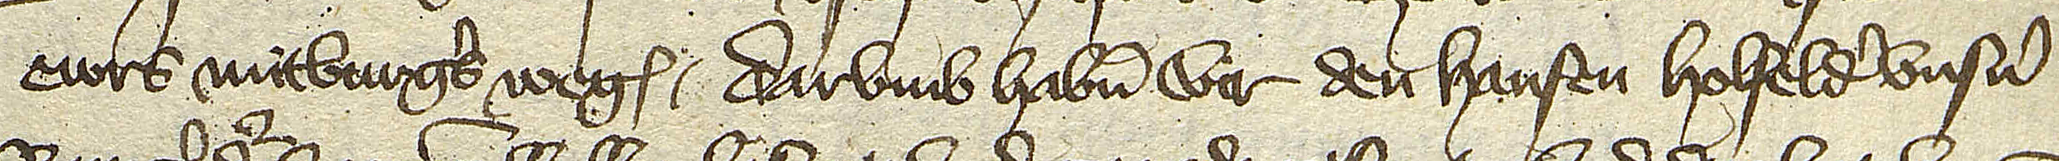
ewrs mitburgs* weg* / Darvmb habn* wir den hanſen holfeld* vnſn*
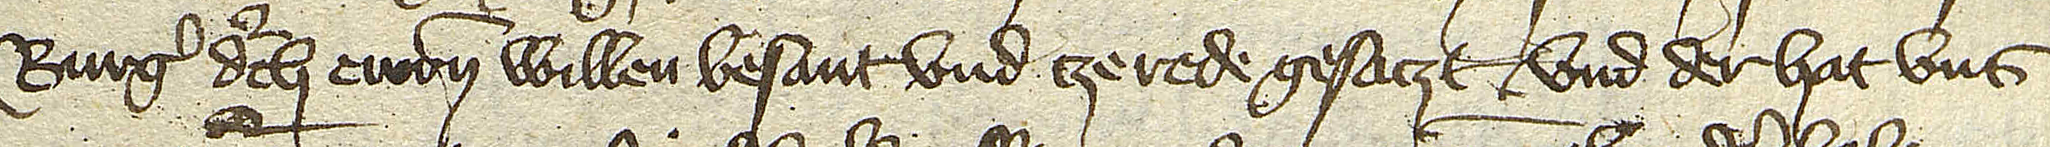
Burg* d*ch ewrn* willen beſant vnd cʒerede geſacʒt / vnd der hat vns
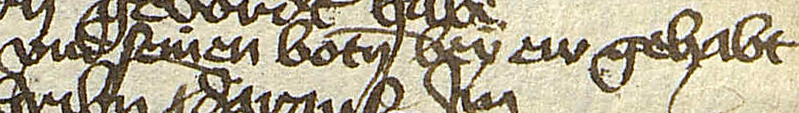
vnd ſeinen botn* bey ew gehabt
